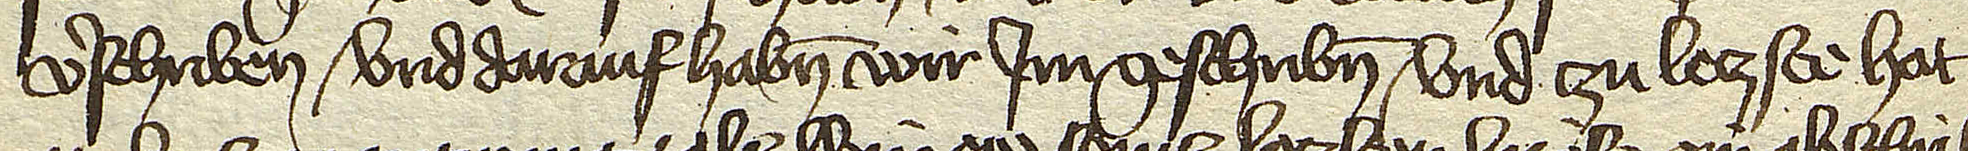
v*ſchriben / vnd darauf habn* wir Im geſchribn* vnd cʒu lecʒſte hat
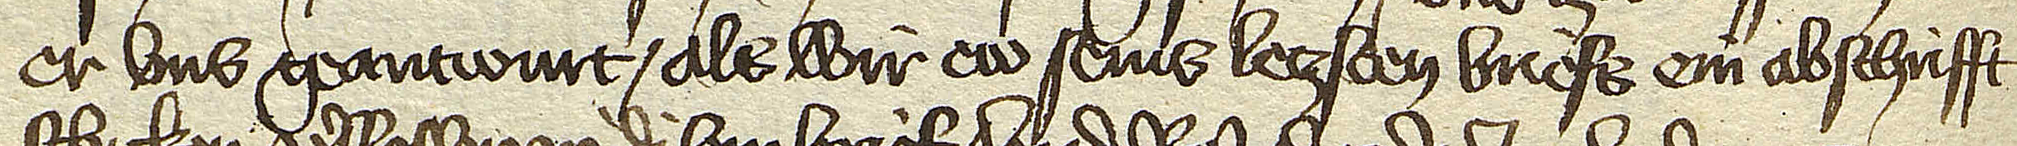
er vns geantwurt / als wir ew ſeins lecʒſten briefs ein abſchrift
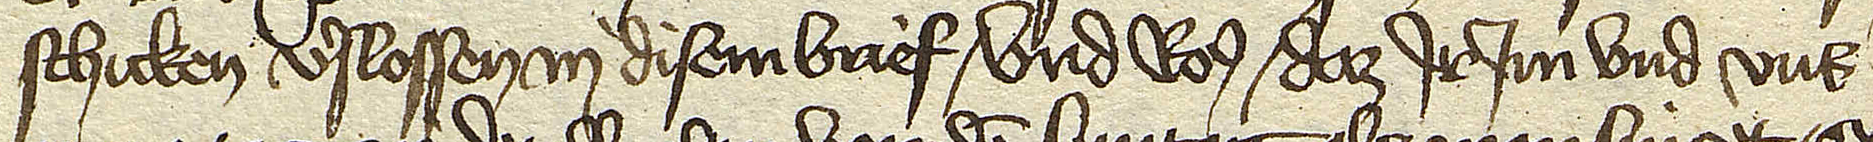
ſchicken v*ſloſſen in diſem brief / vnd Ro* / daʒ Ir Im vnd vns
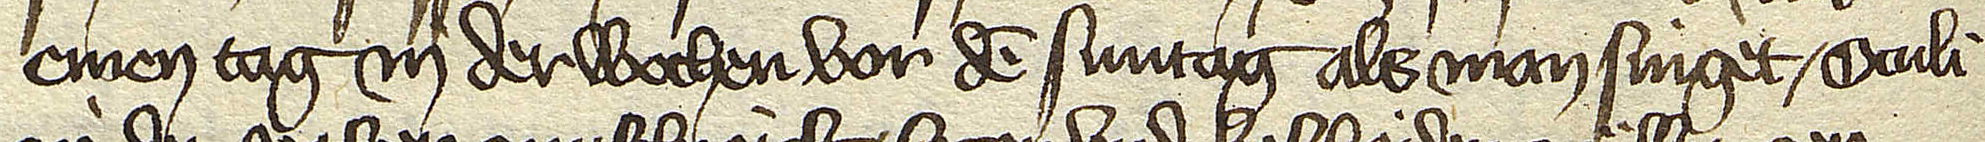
einen tag in der wochen vor de* ſuntag als man ſinget / Oculi
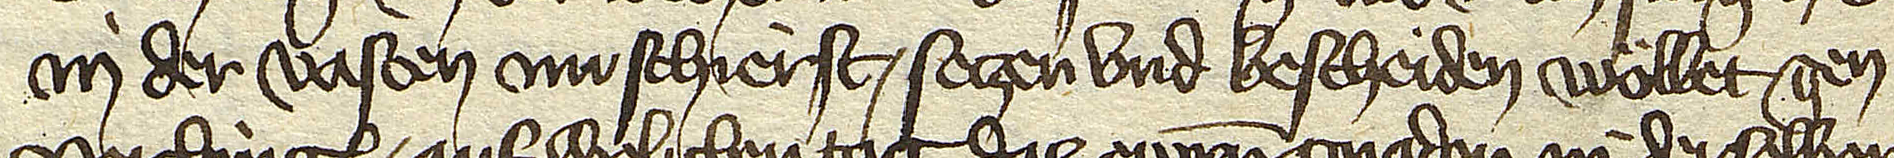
in der vaſten nu ſchierſt / ſecʒen vnd beſcheiden wöllet gen
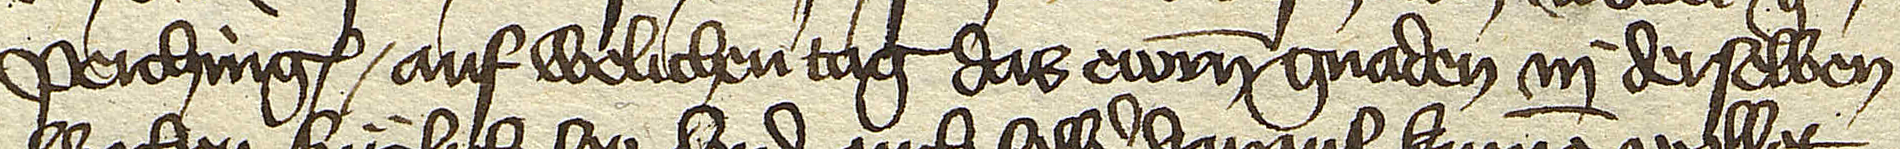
Perching* / auf welichen tag das ewrn* gnaden in derſelben
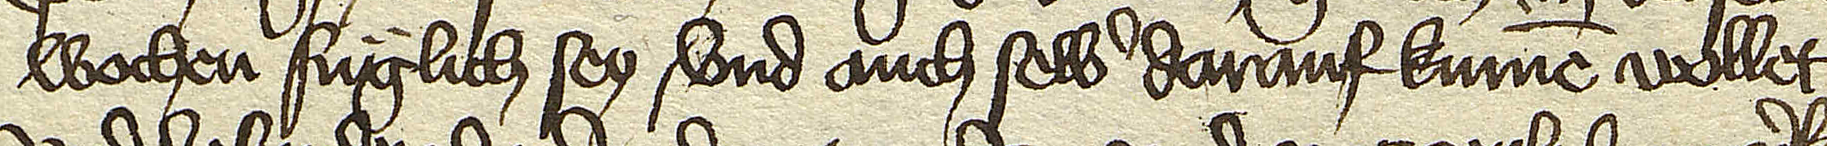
wochen füglich ſey / vnd auch ſelb* darauf kume* wollet
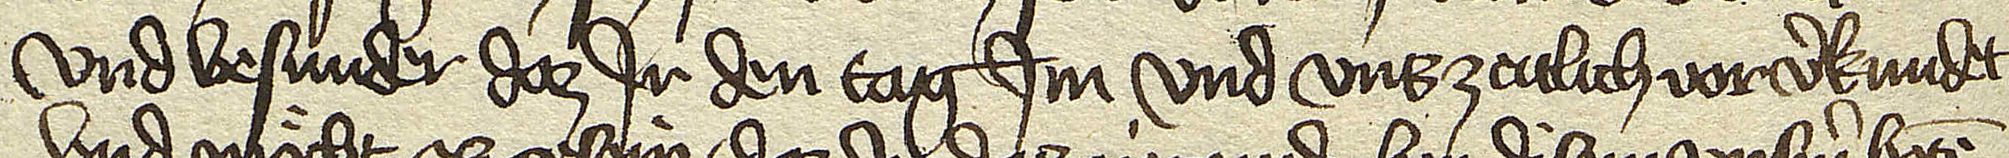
vnd beſunder daʒ Ir den tag Im vnd vns cʒeitlich vor v*kundet
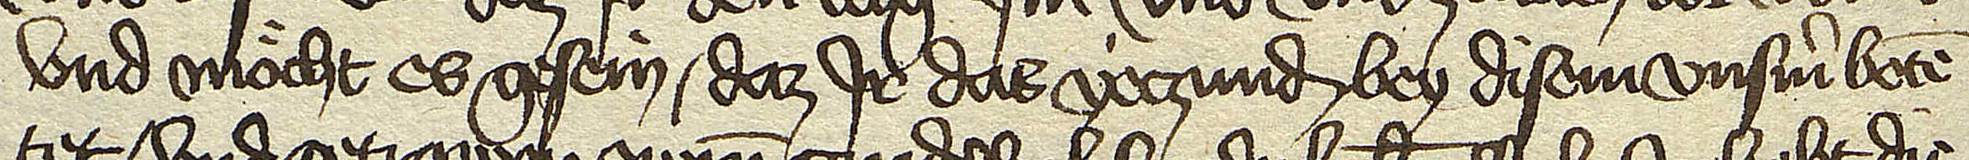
vnd möcht es geſein / daʒ Ir das yecʒund* bey diſem vnſm* bote*
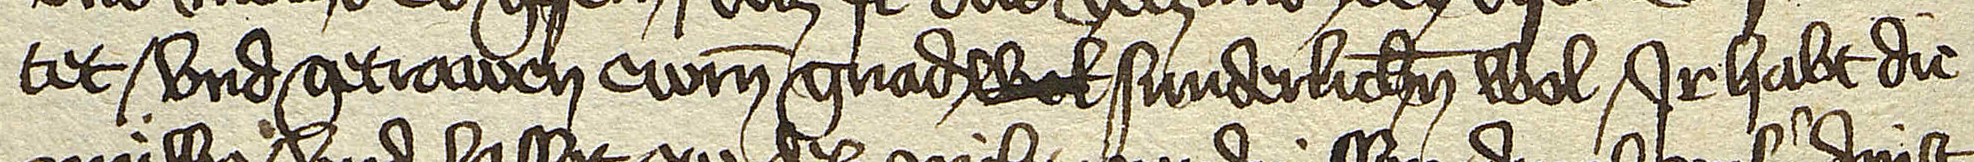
tet / vnd getrawen ewrn* gnad* wol ſunderlichn* wol / Ir habt die
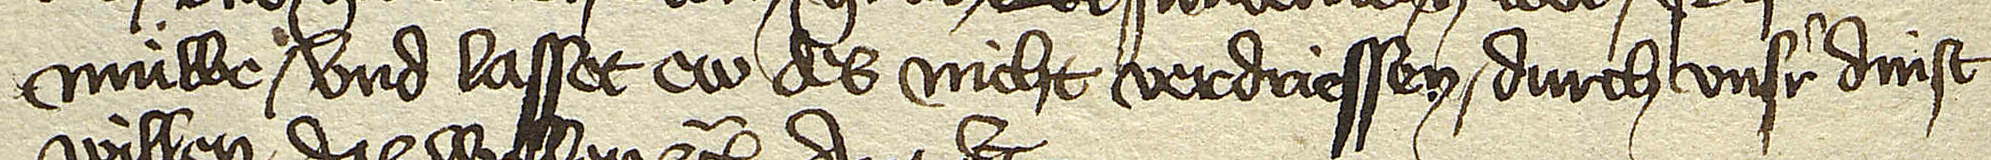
müwe / vnd laſſet ew des nicht verdrieſſen / durch vnſr* dinſt
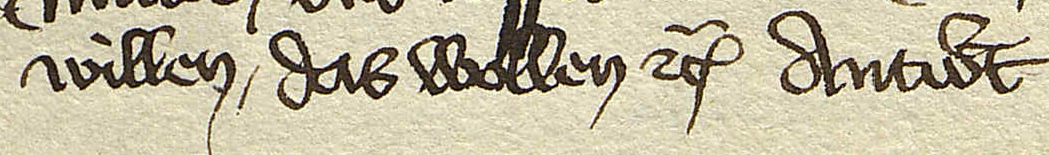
willen / das wollen ec* Antwt*
